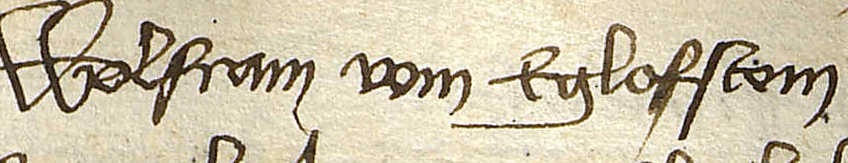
Wolfram vom Eglofſtein
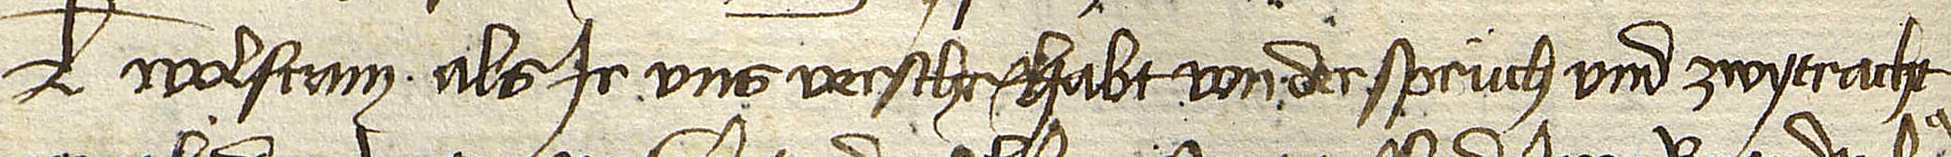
L* wolfram . als Ir vns verſchr* habt von der ſprüch vnd ʒwytracht
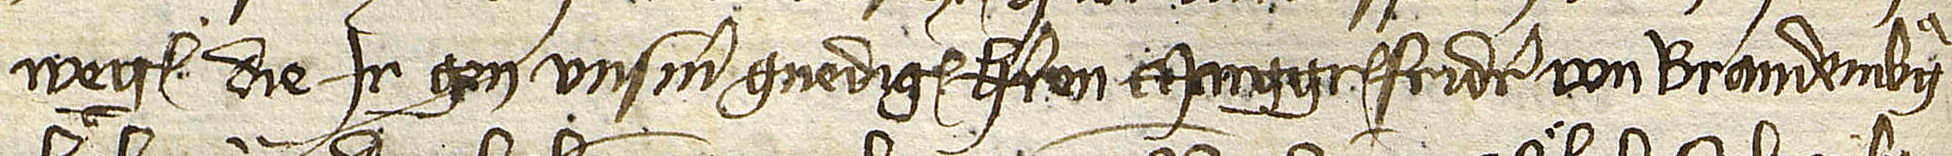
weg* die Ir gen vnſm* gnedig* h*ren Marggr* Fridr* von Brandemb*g
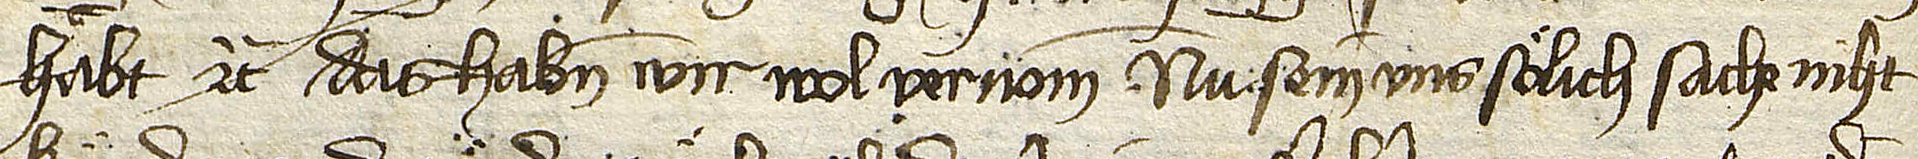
habt ec* / das habn* wir wol vernom* Nu ſein vns ſölich ſache niht
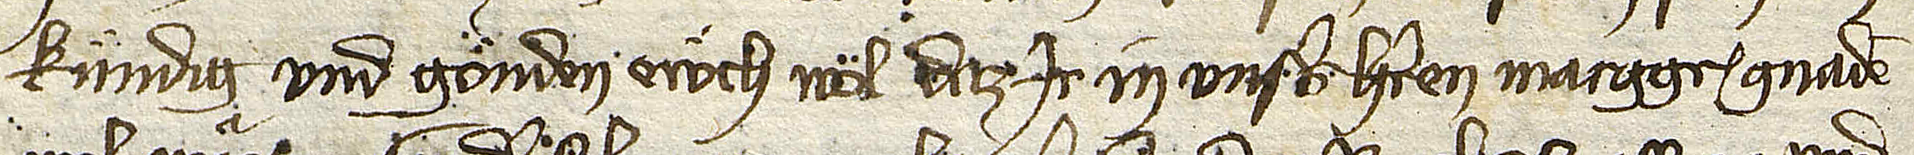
kündig vnd gönden ewch wol daʒ Ir in vnſs* hr*en marggr* gnade*
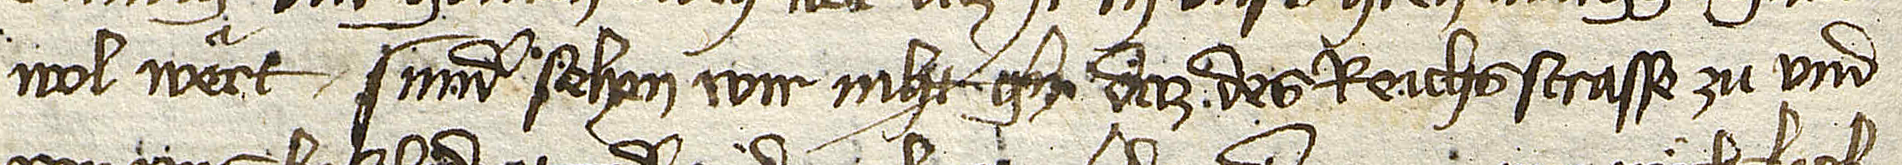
wol wërt / ſund* ſehen wir niht gn* daʒ des Reichs ſtraſſe ʒu vnd
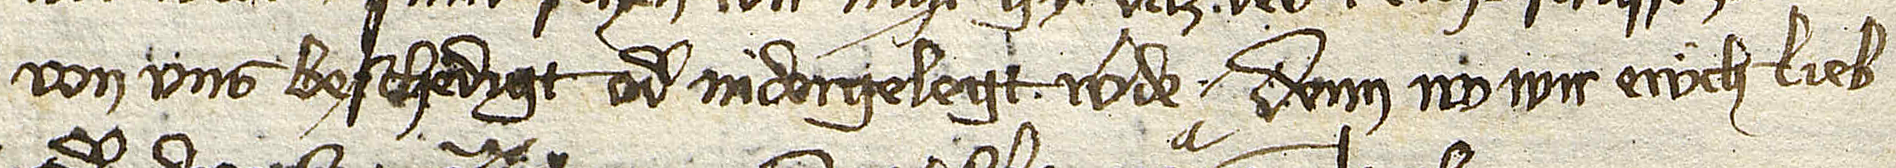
von vns beſchedigt od* nidergelegt . w*de / Denn wo wir ewch lieb
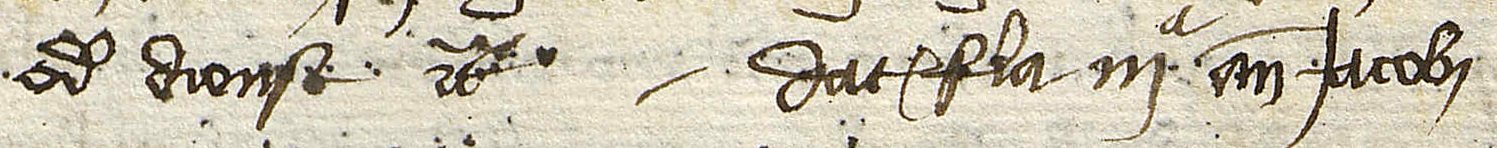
od* dienſt ec* / Dat* fi*a iii* an* Iacobi
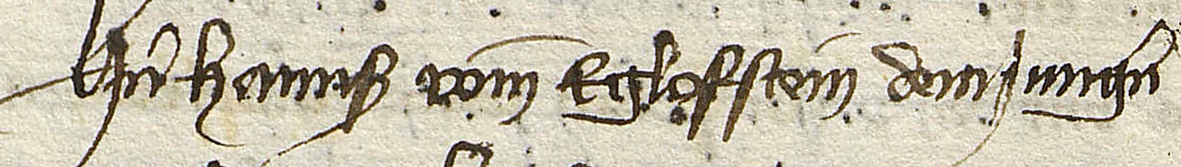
Hn* hannſ* vom* Eglofſein dem Iung*n
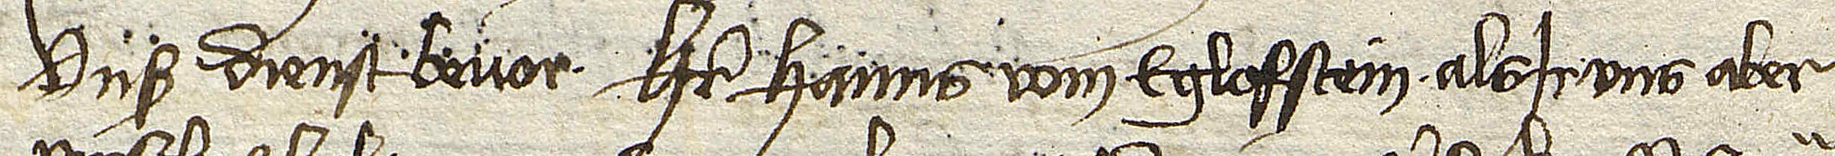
Vnſ* dienſt beuor Hr* Hanns vom Eglofſtein . als Ir vns aber
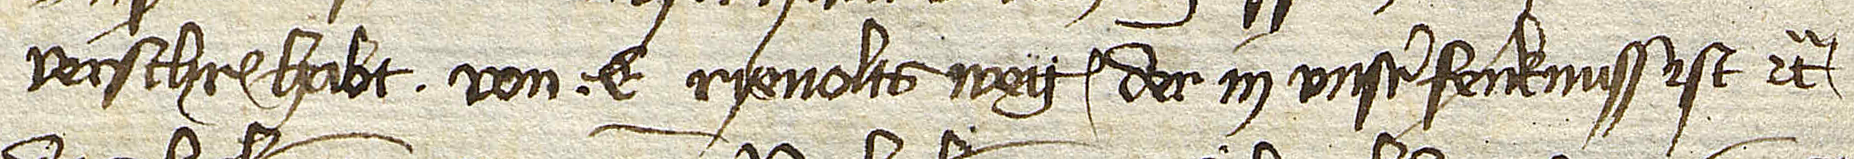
verſchr* habt . von . C . ryenolts weg* der in vnſr* fenknuſſ iſt ec*
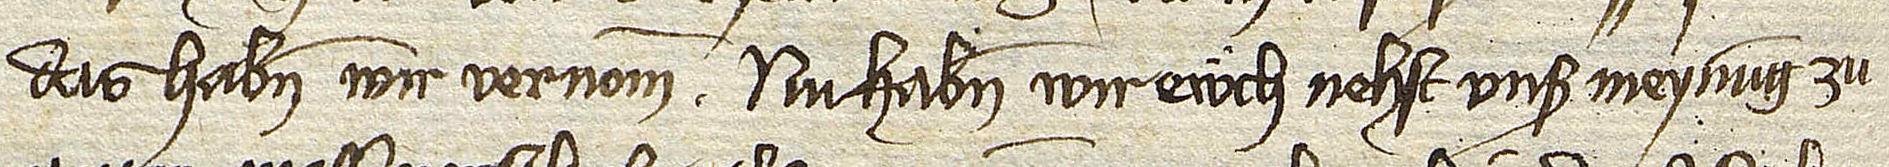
das habn* wir vernom* . Nu habn* wir ewch nehſt vnſ* meynug* ʒu
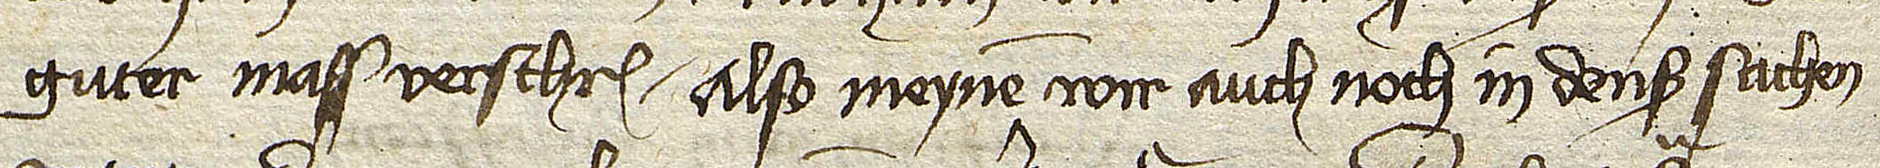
guter maſſ verſchr* / Alſo meyne* wir auch noch in denſ* ſachen
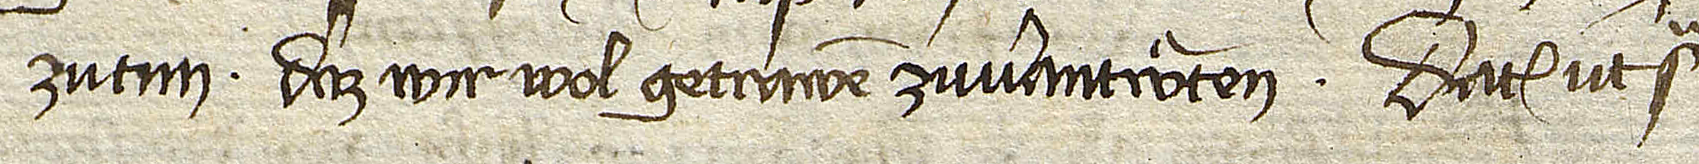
ʒutun . daʒ wir wol getrawe* ʒuu*antw*ten . Dat* ut ſ*
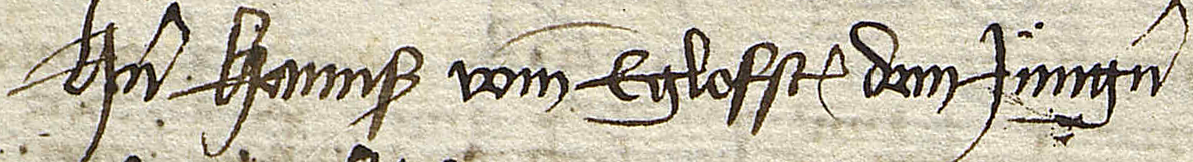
Hn* Hannſ* vom Eglofſt* dem Iüngn*
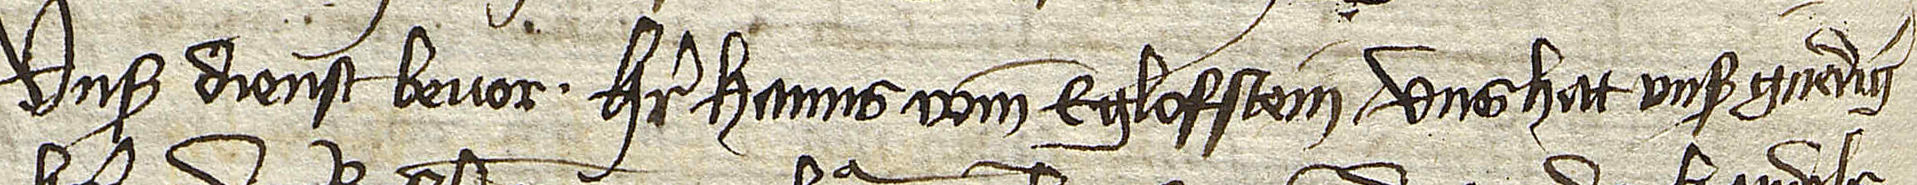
Vnſ* dienſt beuor . Hr* Hanns vom* Eglofſtein / Vns hat vnſ* gnedig*
